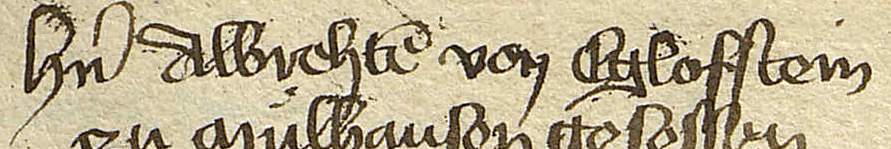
hn* Albrechte* von Eglofſtein
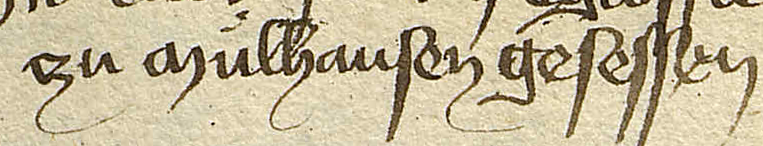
cʒu Mülhauſen geſeſſen
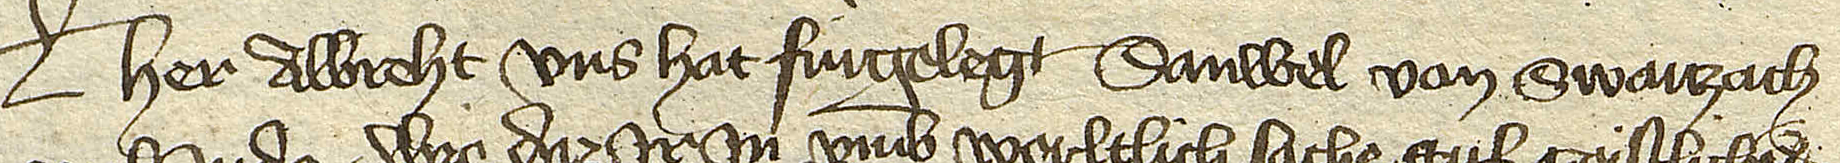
L* her Albreht vns hat fürgelegt Sanwel von Swarcʒach
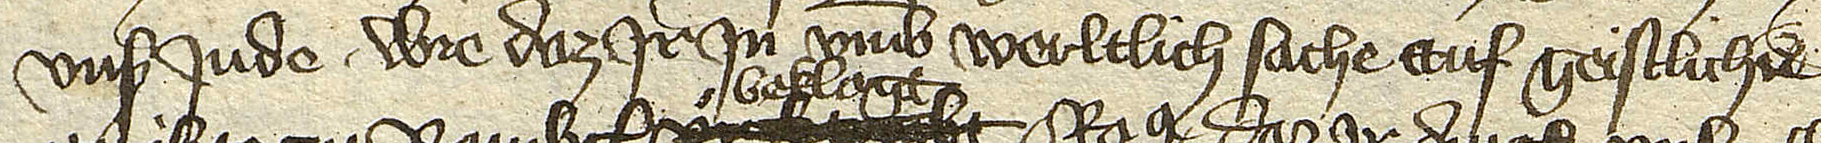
vnſ* Iude / wie daʒ Ir vmb werltlich ſache auf geiſtlichn*
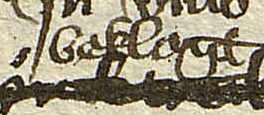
beklagt
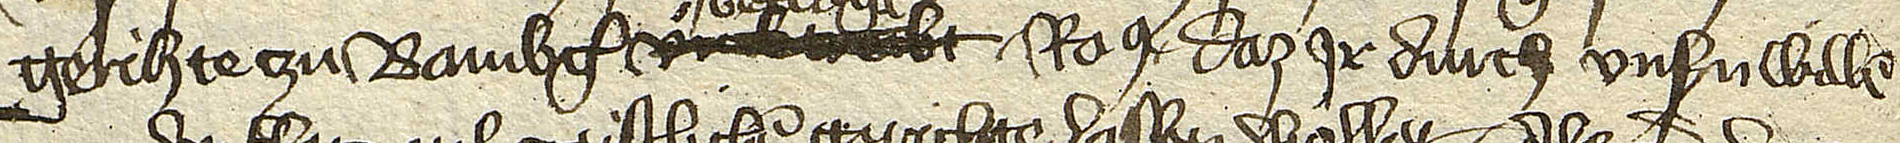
gerihte cʒu Bambg* v̈mbtreibt / Ro* / daʒ Ir durch vnſ*n wille*
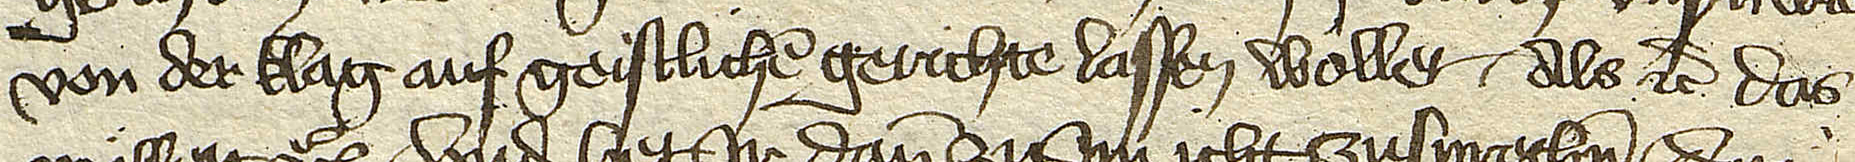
von der klag auf geiſtliche* gerichte laſſen wollet / Als ec* das
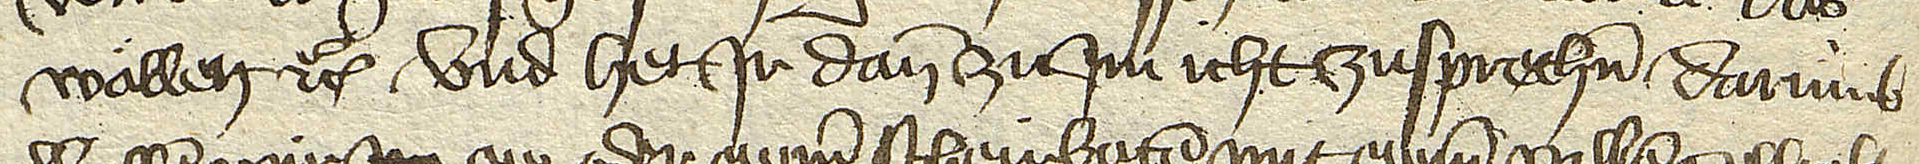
wöllen ec* / vnd het Ir dan* cʒu Im icht cʒuſprechn* / darümb
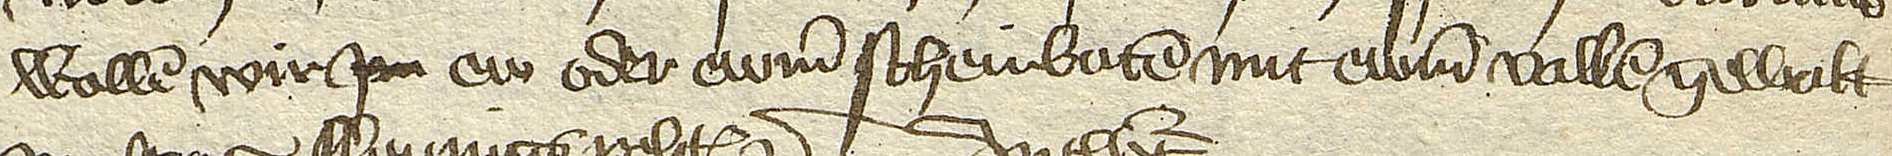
wolle* wir Im ew oder ewm* ſcheinbote* mit ewm* volle* gewalt
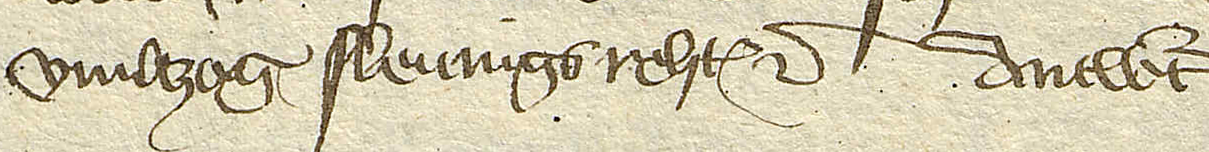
vnu*cʒog* ſlewnigs reht* ec* Antw*t
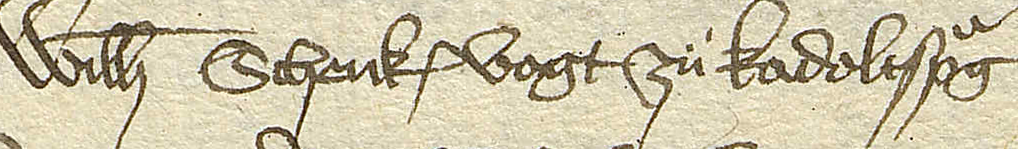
Wilh* Schenk* vogt cʒü kadoltſp*g
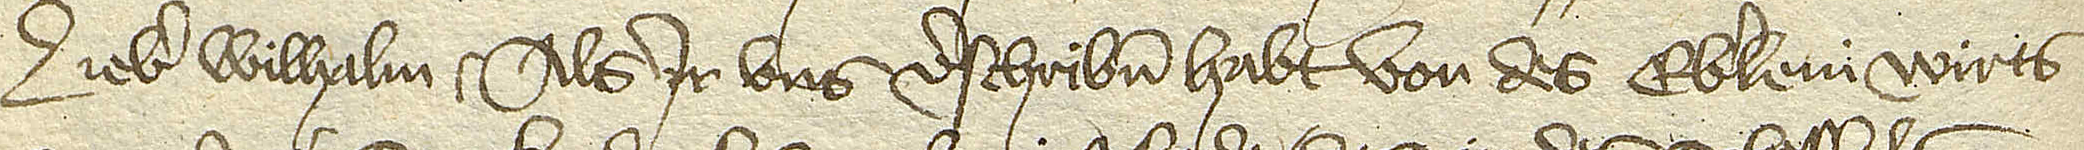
Lieb* wilhalm / Als Ir vns v*ſchribn* habt von des Eb*lein wirts
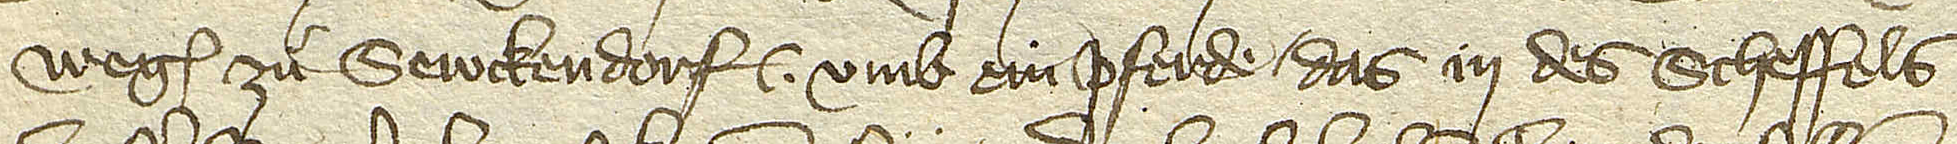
weg* cʒü Sewckendorf / . vmb ein pferde / das in des Scheffels
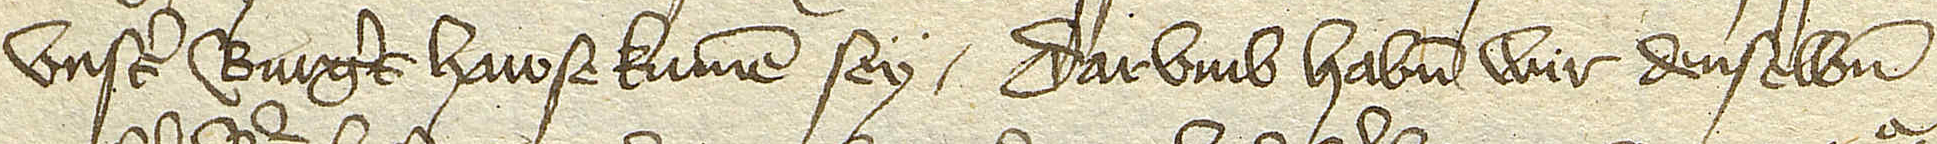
vnſ*s Burg*s hawſe kume* ſey / Darvmb habn* wir denſelbn*
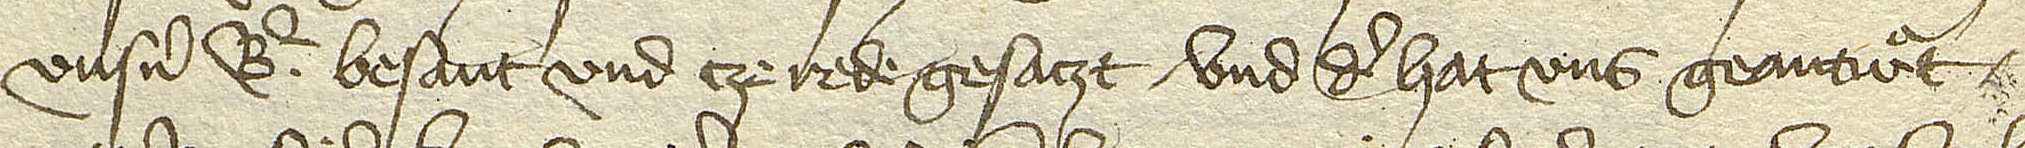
vnſn* B* . beſant vnd cʒe rede geſacʒt / vnd d* hat vns geantw*t /
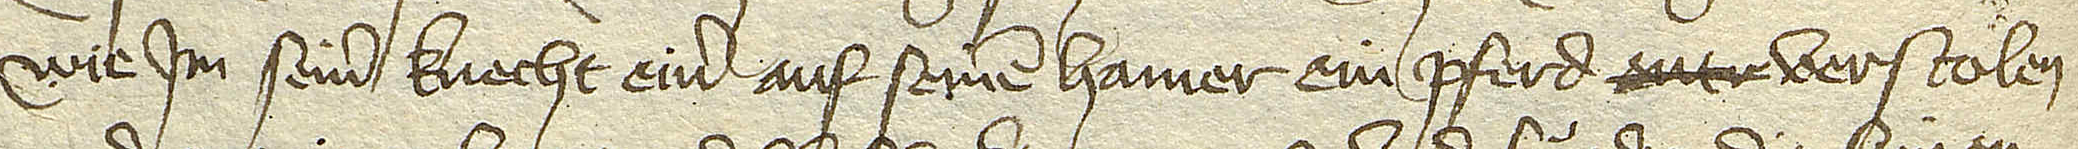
wie Im ſein* knecht ein* auf ſeine* hamer ein pferd entr verſtolen
